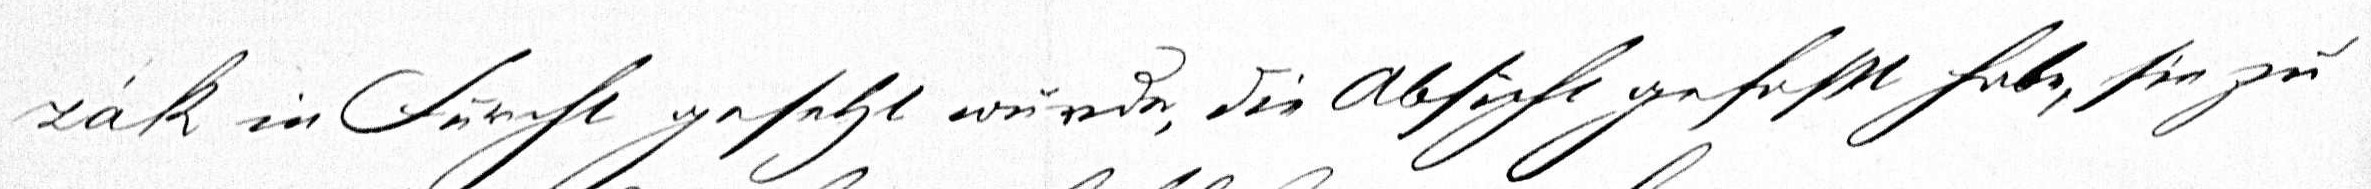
zák in Furcht gesetzt wurde, die Absicht gefaßt habe, sie zu
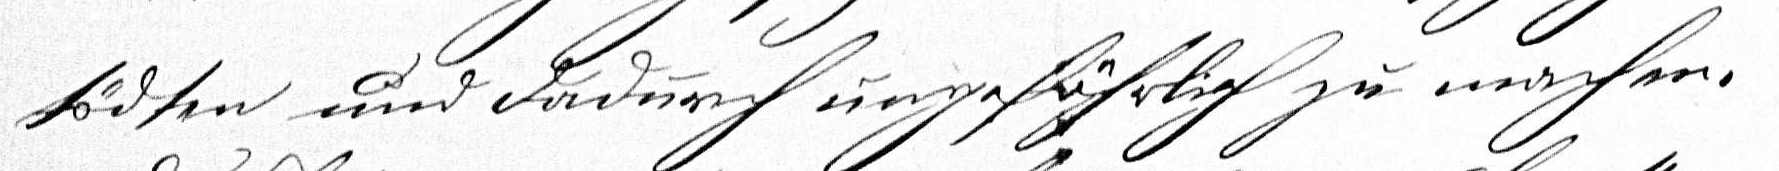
tödten und dadurch ungefährlich zu machen.
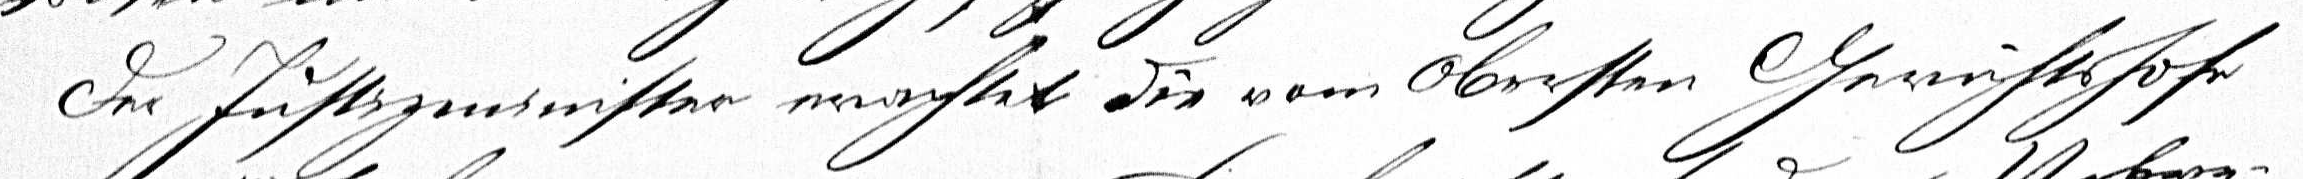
Der Justizminister erachtet die vom Obersten Gerichtshof
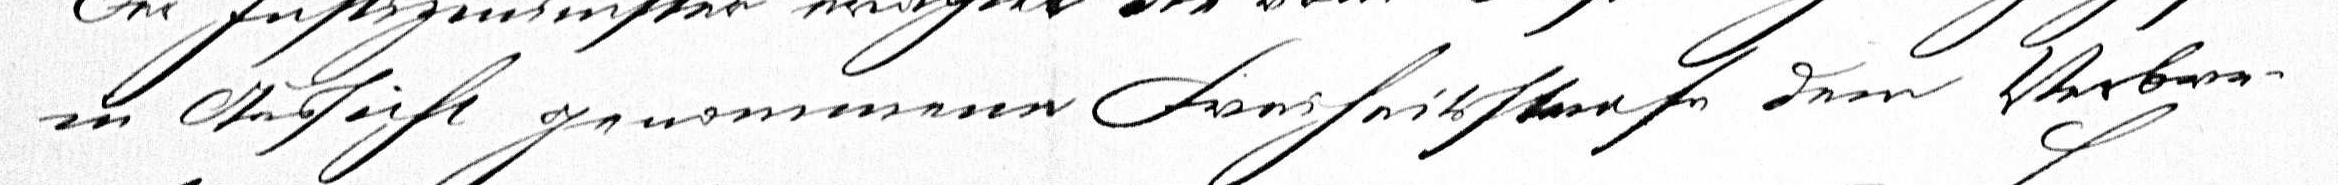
in Aussicht genommene Freiheitsstrafe dem Verbre¬
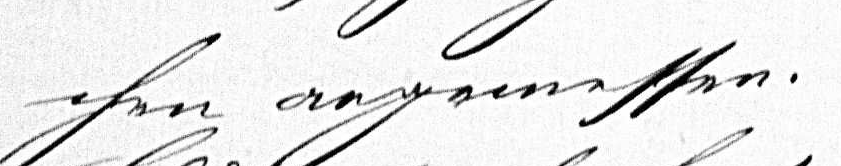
chen angemessen.
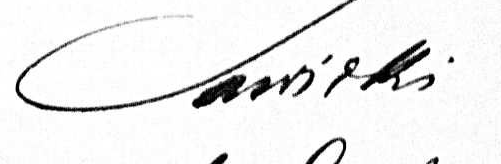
Sawicki
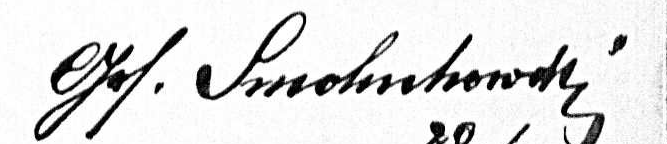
Ges. Smolnchowksi
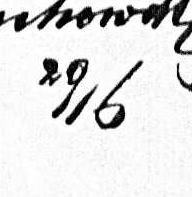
29/6
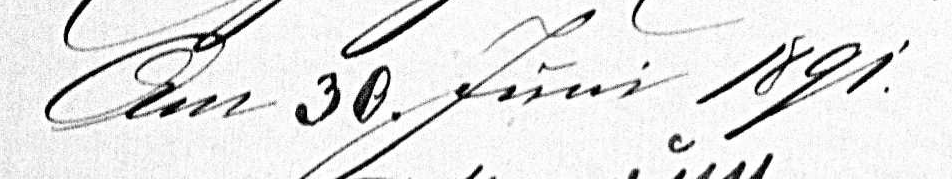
Am 30. Juni 1891
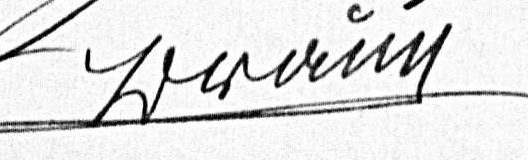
Wraun
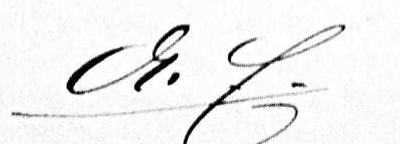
A E
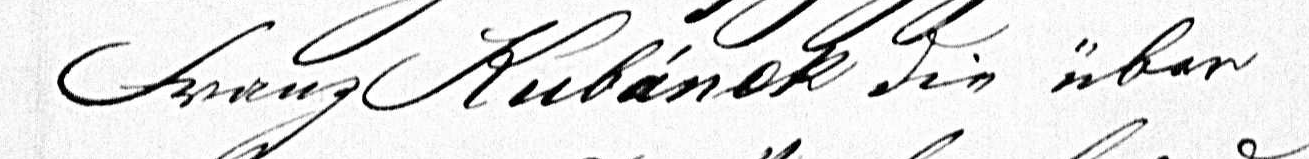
Franz Kubánek die über
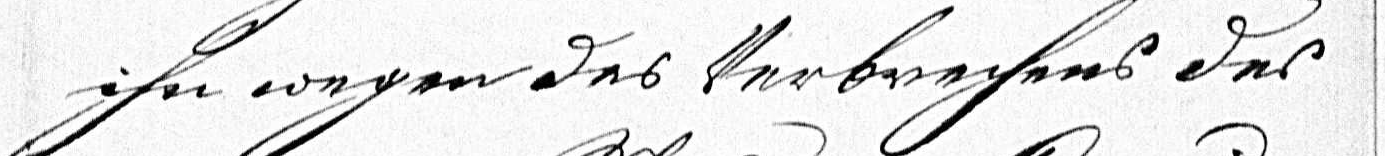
ihn wegen des Verbrechens des
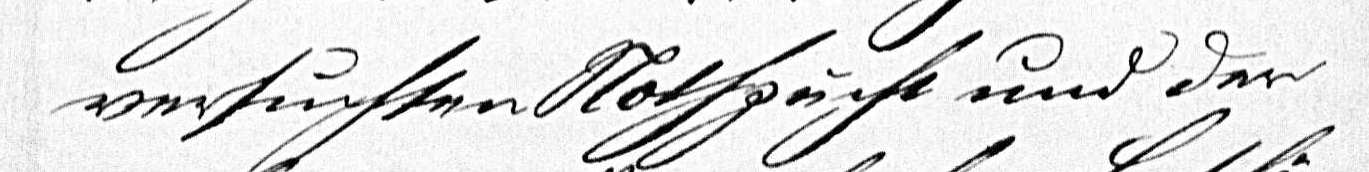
versuchten Nothzucht und der
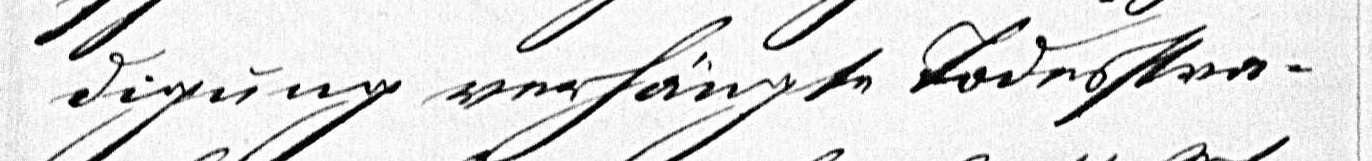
digung verhängte Todesstra¬
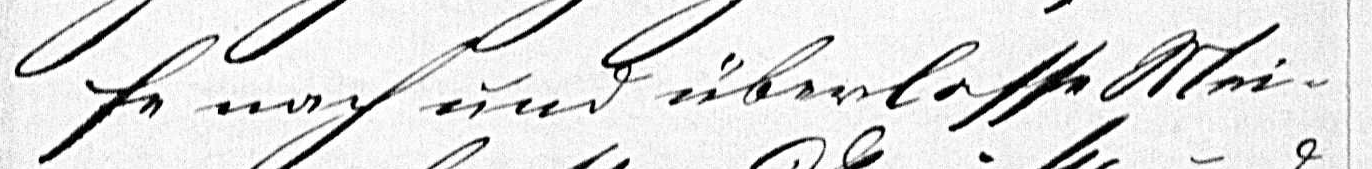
fe nach und überlasse Mei¬
